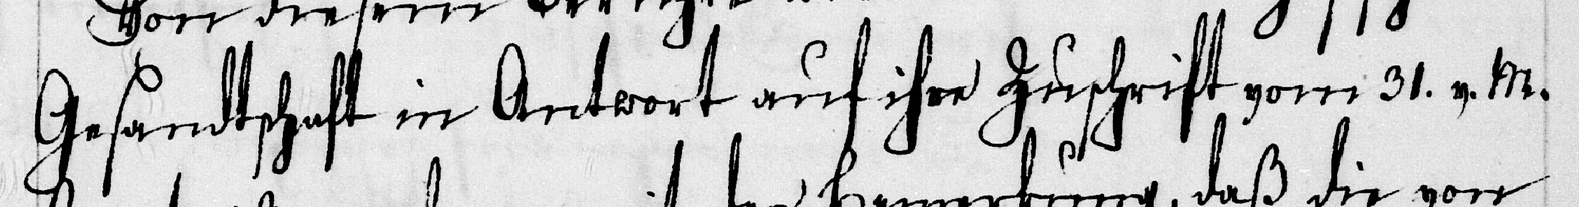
Gesandtschaft in Antwort auf ihre Zuschrift vom 31. v. M.
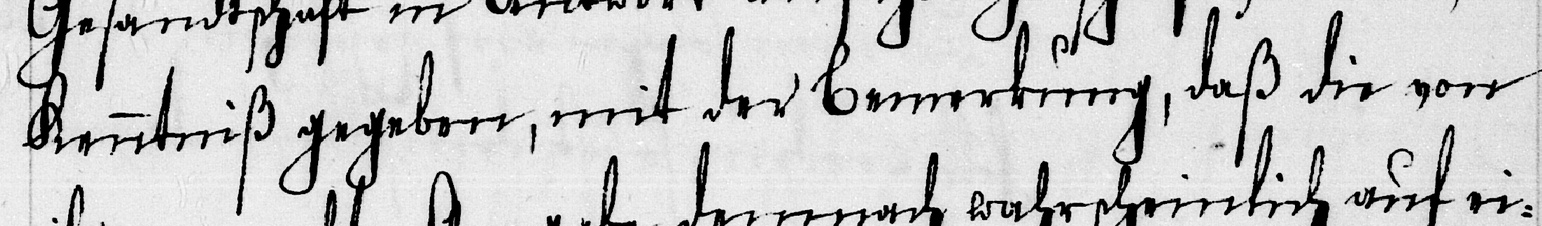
Kenntniß gegeben, mit der Bemerkung, daß die von
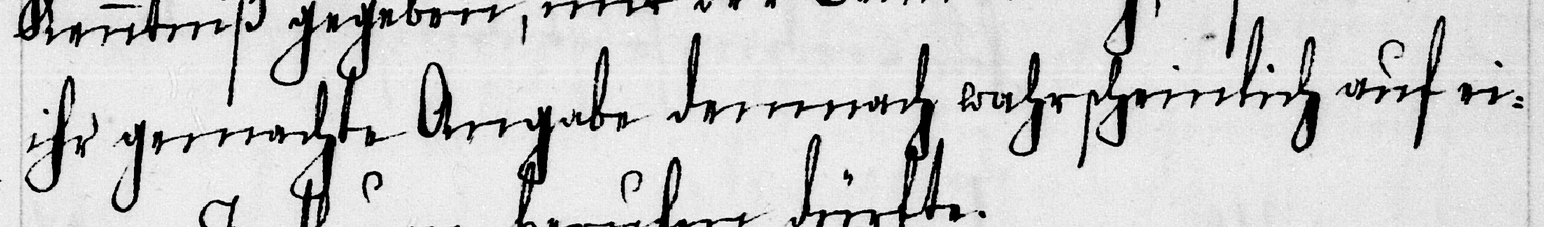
ihr gemachte Angabe demnach wahrscheinlich auf ei¬
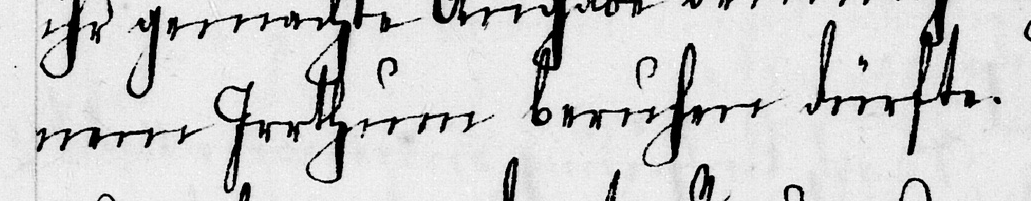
nem Irrthum beruhen dürfte.
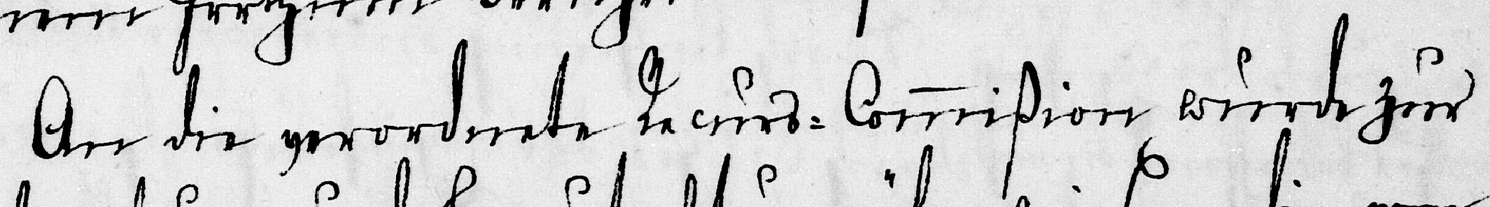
An die verordnete Recurs-Commißion wurde zur
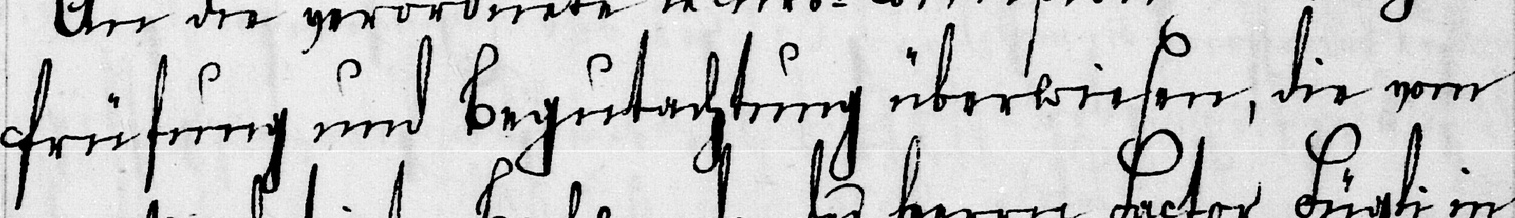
Prüfung und Begutachtung überwiesen, die vom
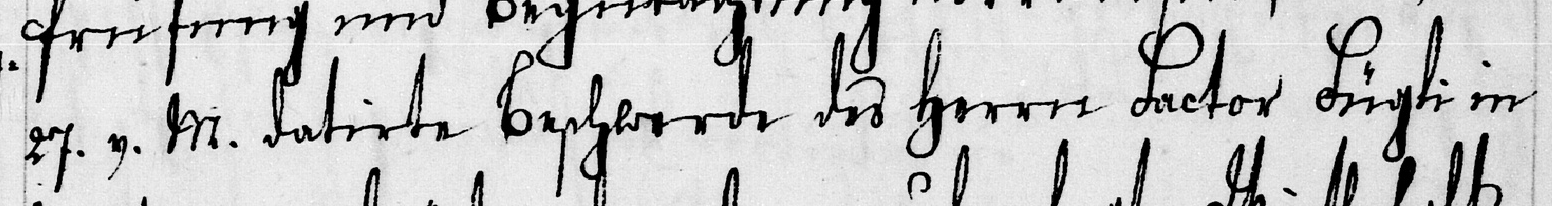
27. v. M. datirte Beschwerde des Herrn Factor Fügli in
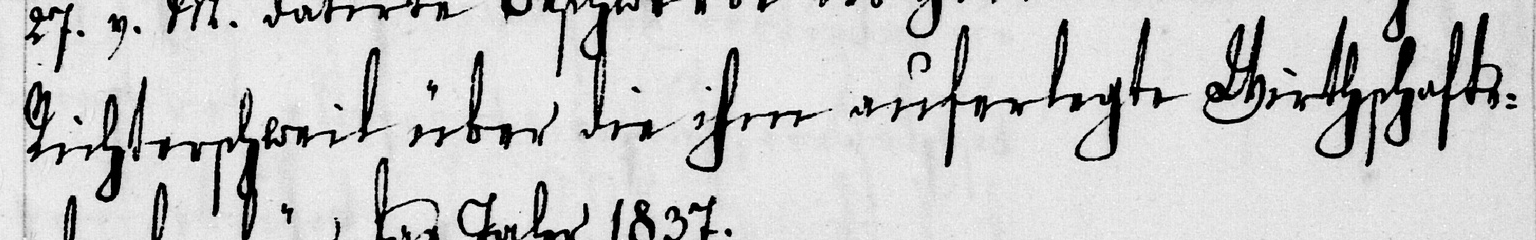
Richterschweil über die ihm auferlegte Wirthschafts¬
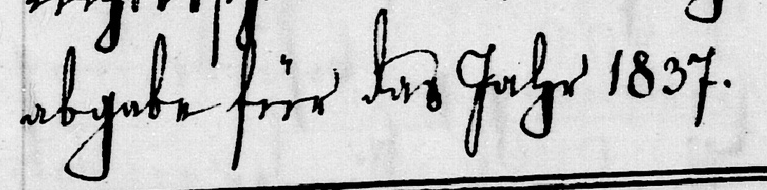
abgabe für das Jahr 1837.
